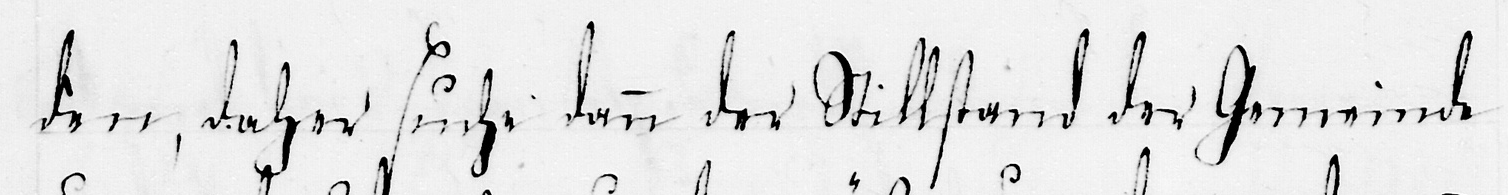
den, daher suche dann der Stillstand der Gemeinde
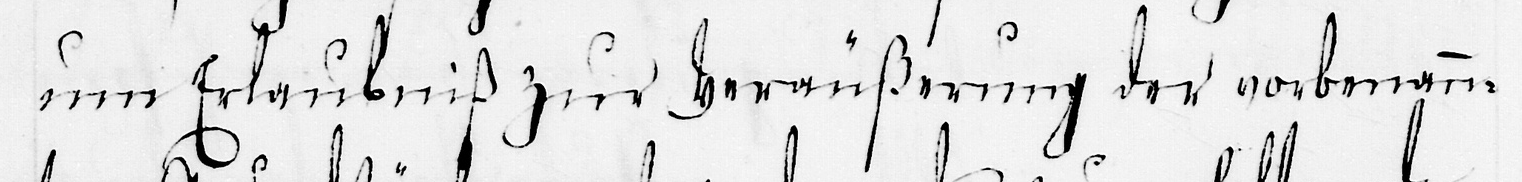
um Erlaubniß zur Veräußerung der vorbenann¬
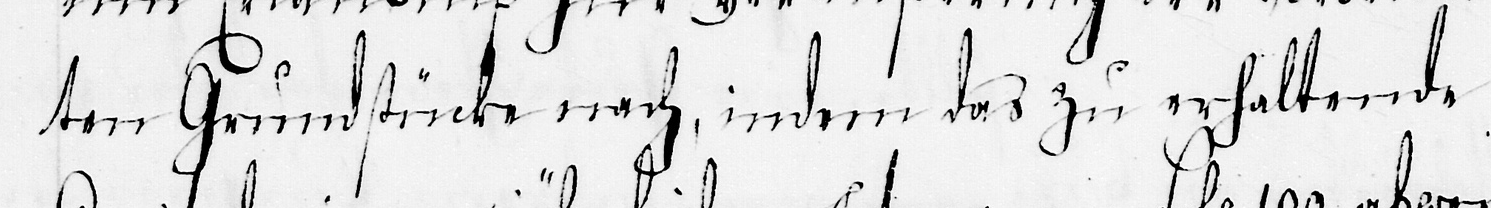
ten Grundstücke nach, indem das zu erhaltende
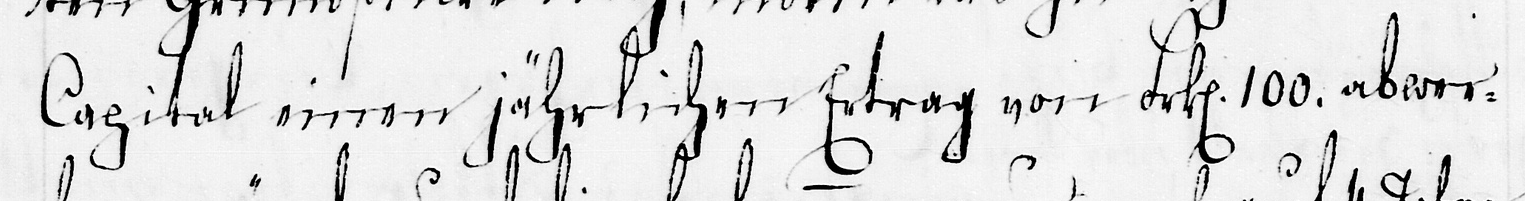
Capital einen jährlichen Ertrag von Frk[en]. 100. abwer¬
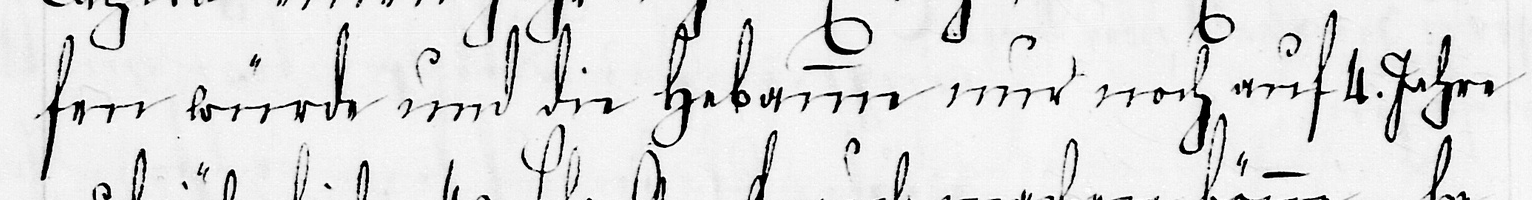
fen würde und die Hebamme nur noch auf 4. Jahre
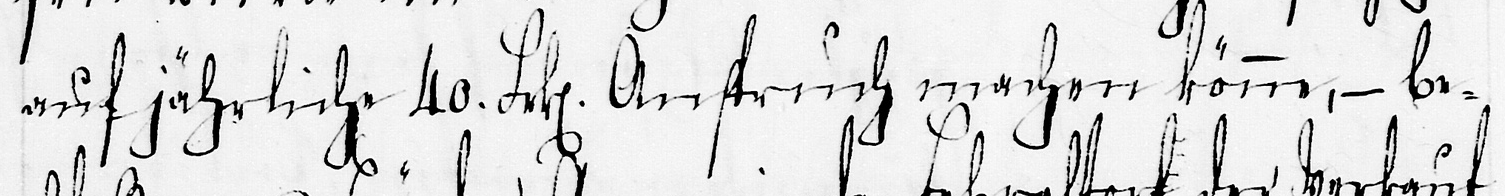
auf jährliche 40. Frk[en]. Anspruch machen könne, – be¬
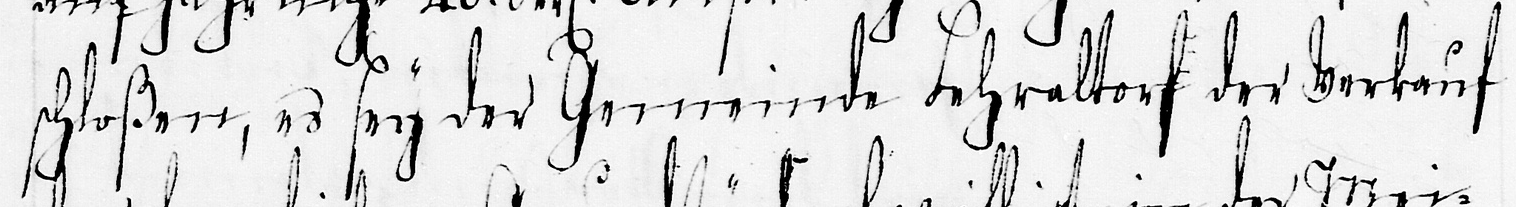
schloßen, es sey der Gemeinde Fehraltorf der Verkauf
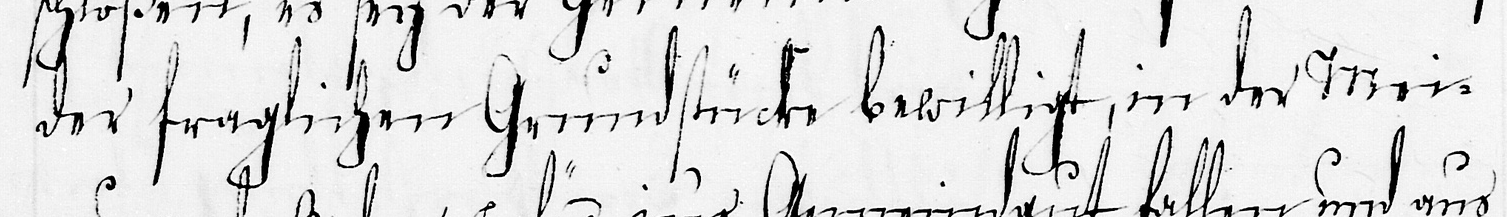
der fraglichen Grundstücke bewilligt, in der Mei¬
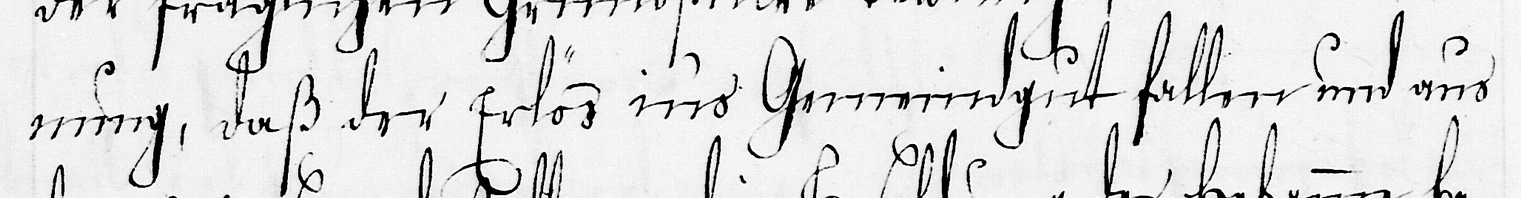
nung, daß der Erlös in’s Gemeindgut fallen und aus
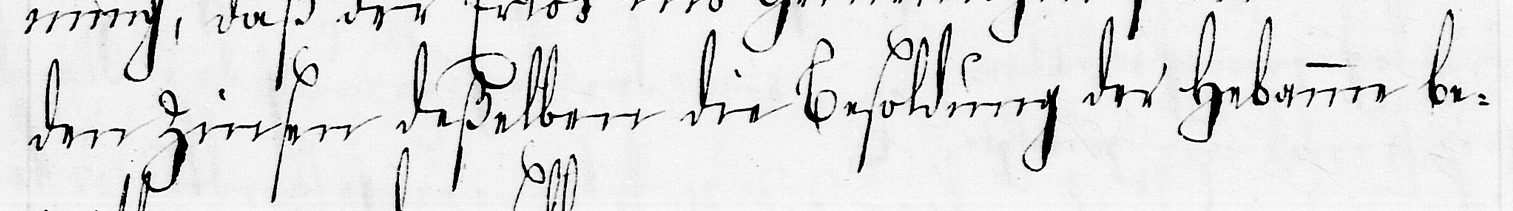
den Zinsen deßelben die Besoldung der Hebamme be¬
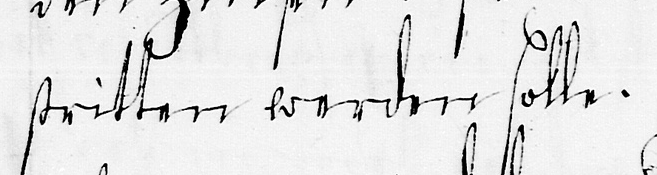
stritten werden solle.
